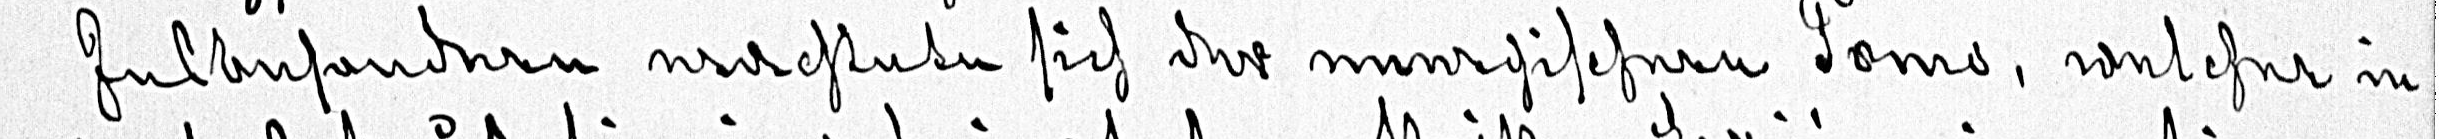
Insbesondere nachtete sich der energischere Tomo, welcher in
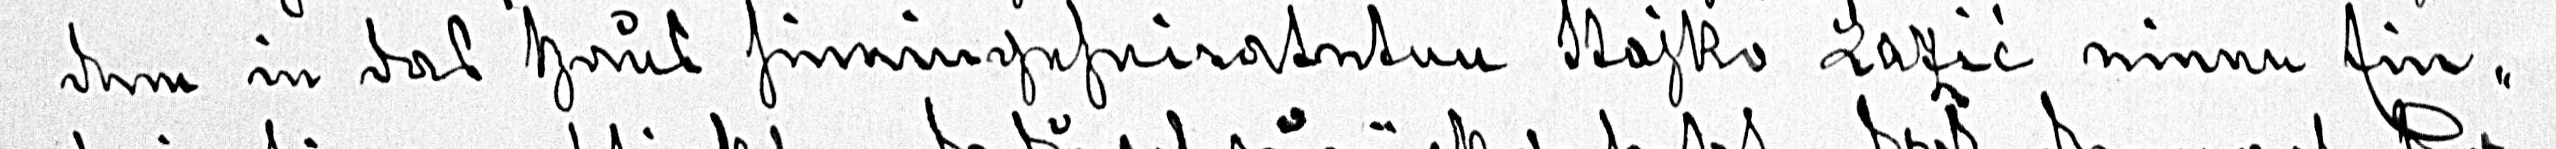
dem in das Haus Hineingeheirateten Kojko Lazić einen Ein¬
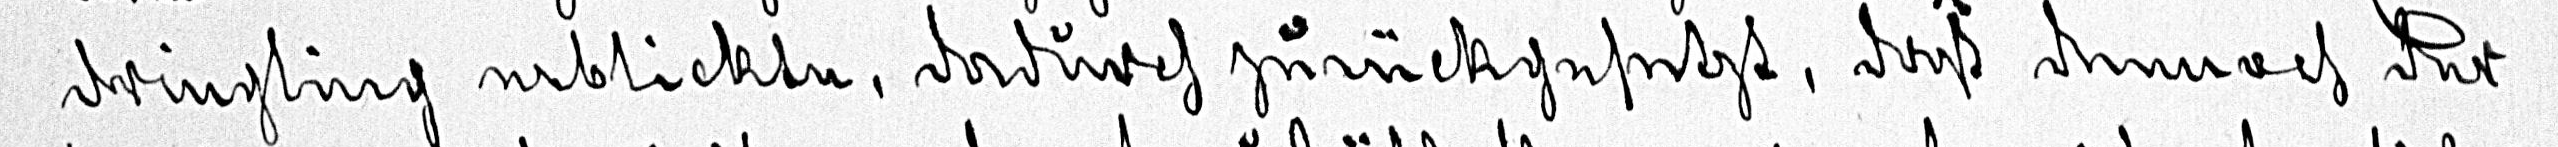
dringling erblickte, dadurch zurückgesetzt, daß danach der
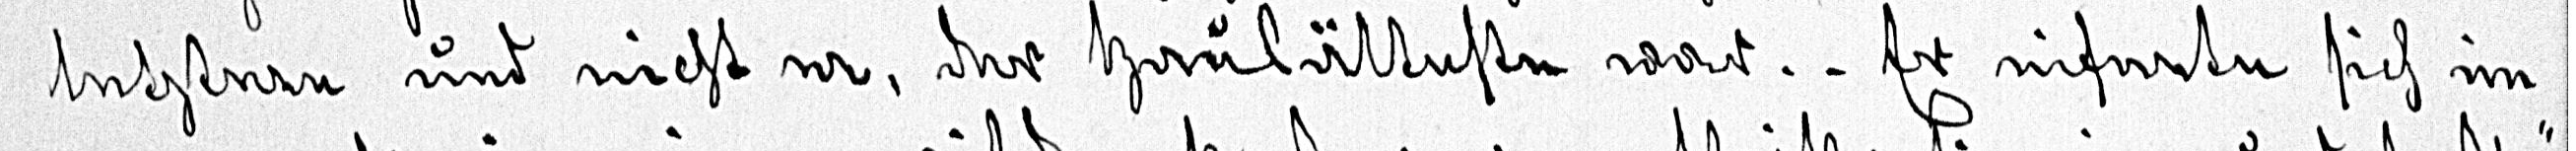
letztere und nicht er, der Hausätteste war. - Er eiferte sich im
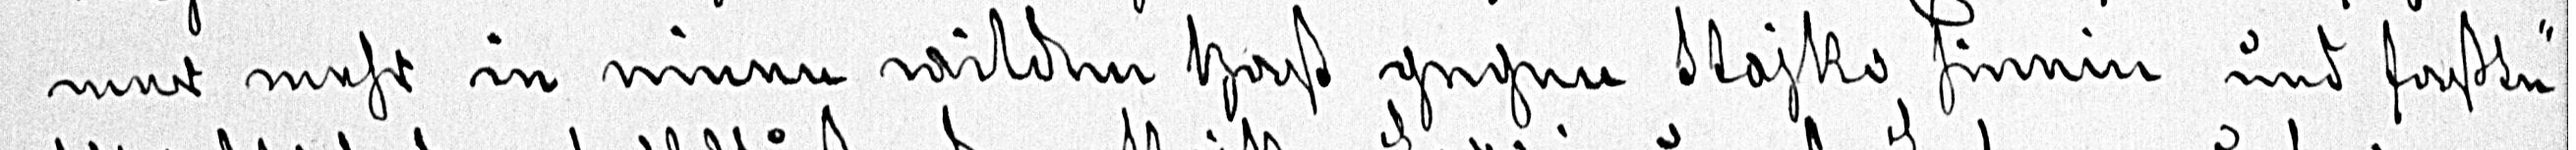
mer mehr in einen wilden Baß gegen Kojko hinein und faßtü
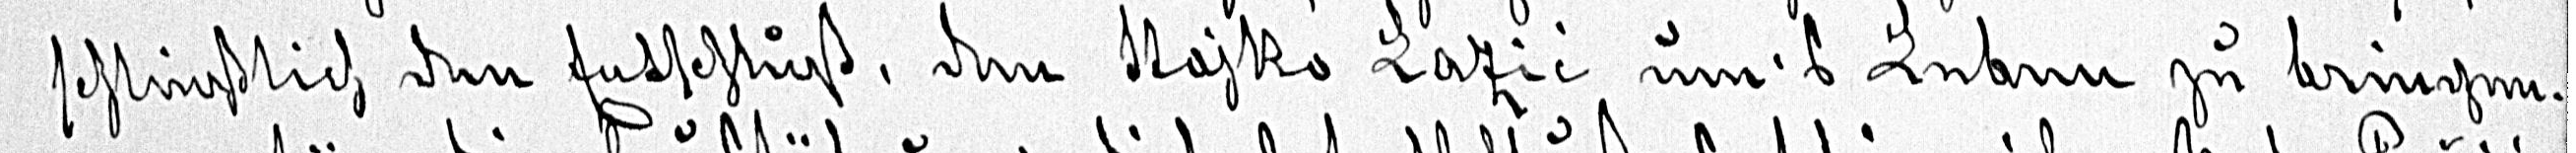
schließlich den Entschluß, den Kojko Lazić ums Leben zu bringen.
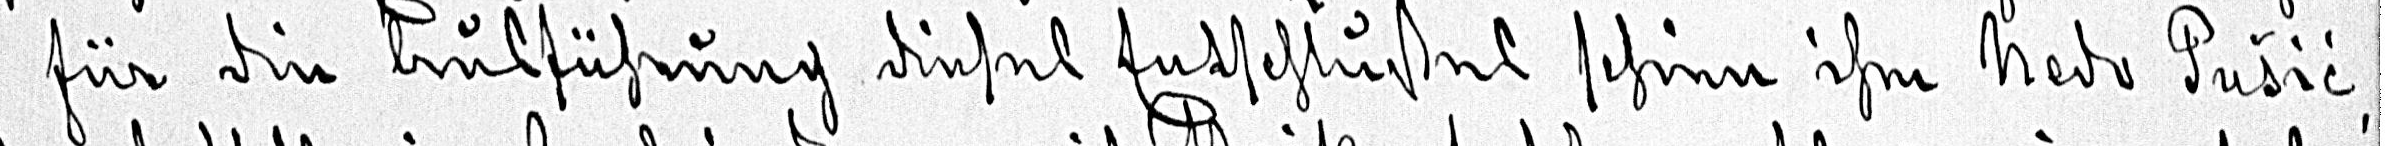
Für die Ausführung dieses Entschlußes schien ihm Nedo Pusić,
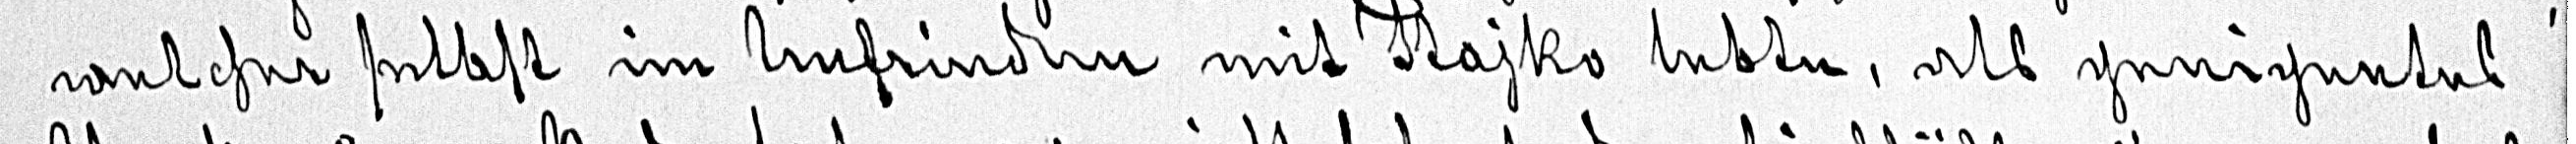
welcher selbst im Unfrieden mit Kojko lebte, als geeignetes
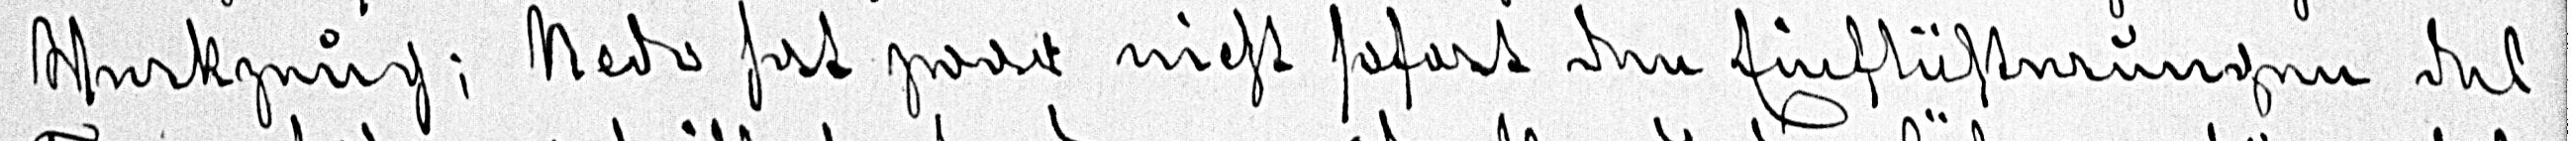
Werkzeug; Nedo hat zweit nicht sofert den Einflüsterungen das
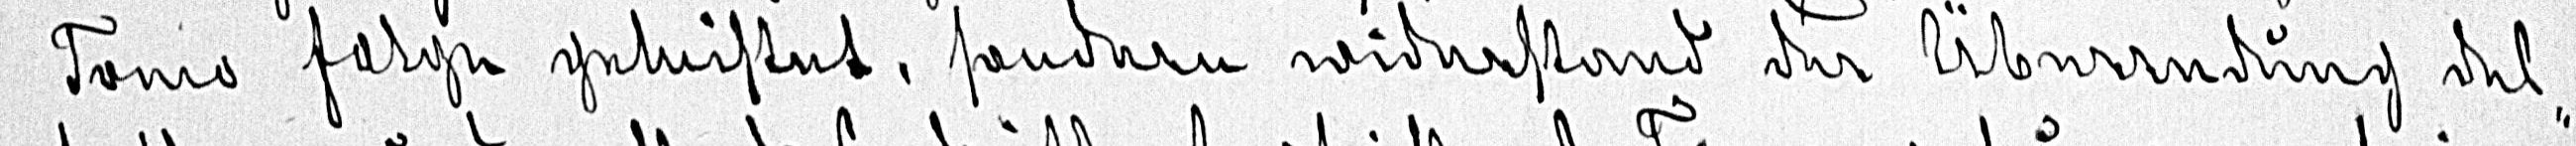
Tomo folge gelichtet, sondern widerstand der Überredung des¬
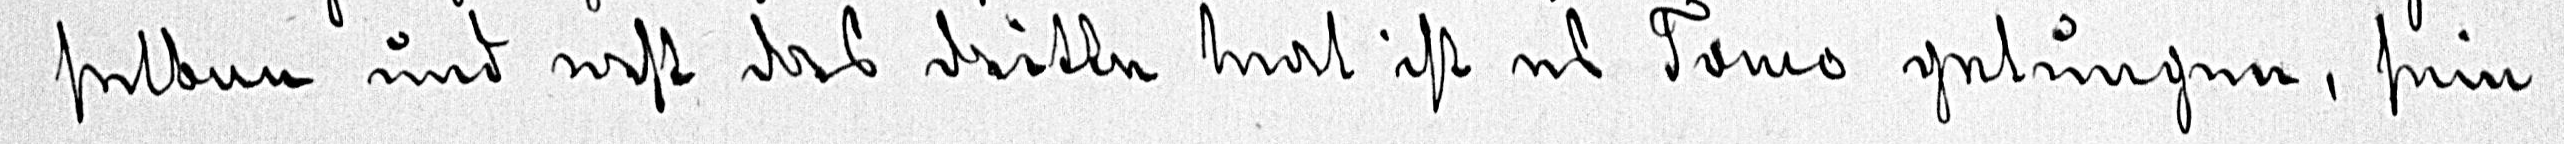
selben und erst das dritte Mal ihr es Tomo gelungen, sein
